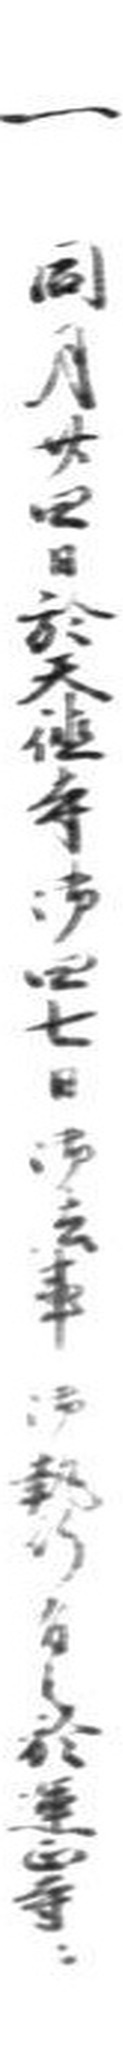一同月廿四日於天徳寺御四七日御法事御執行有之於運正寺も
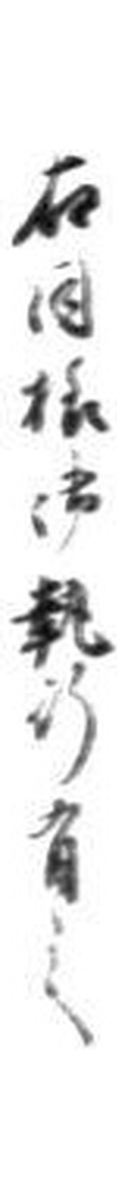右同様御執行有之
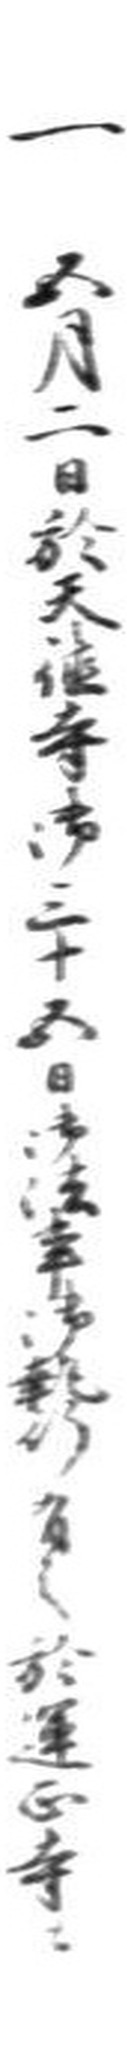一五月二日於天徳寺御三十五日御法事御執行有之於運正寺も
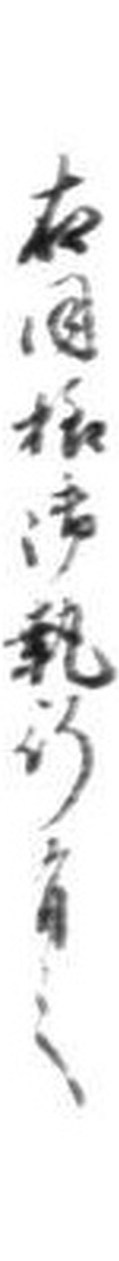右同様御執行有之

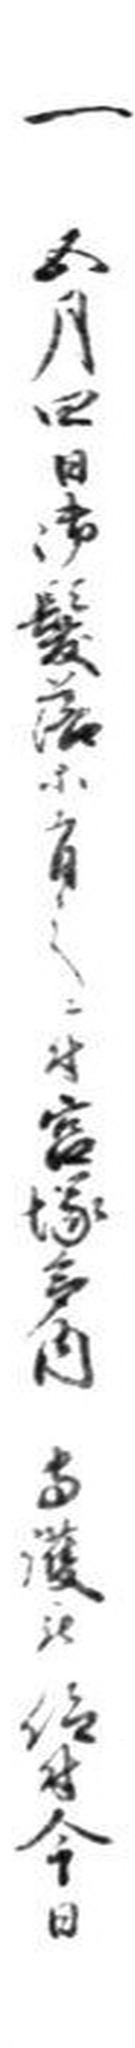一五月四日御髪落等有之ニ付宮塚多内守護被仰付今日
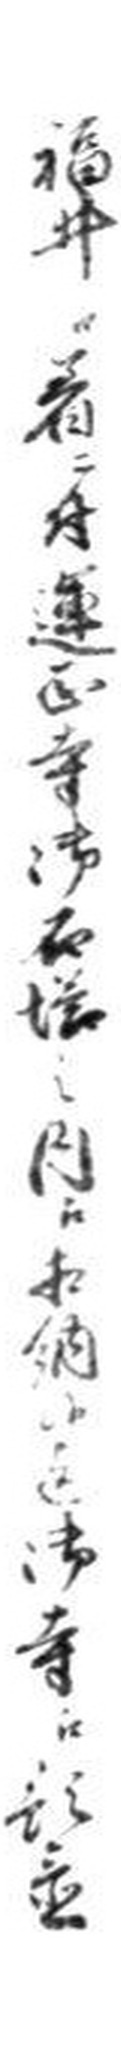福井江着ニ付運正寺御石塔之内江相納候迄御寺江預置
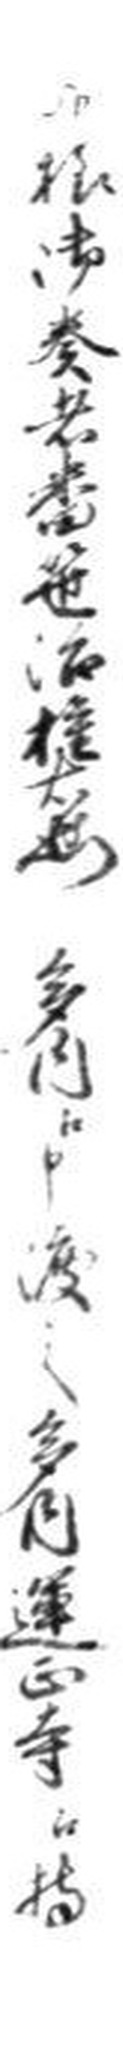候様御奏者番笹治権右衛門多内江申渡之多内運正寺江持
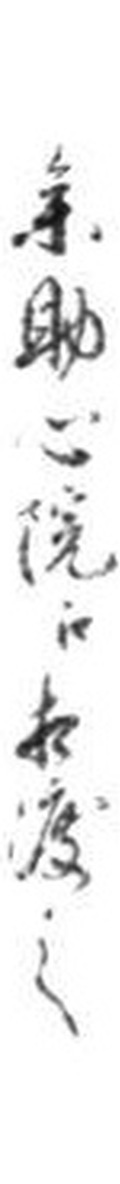参助心院江相渡之
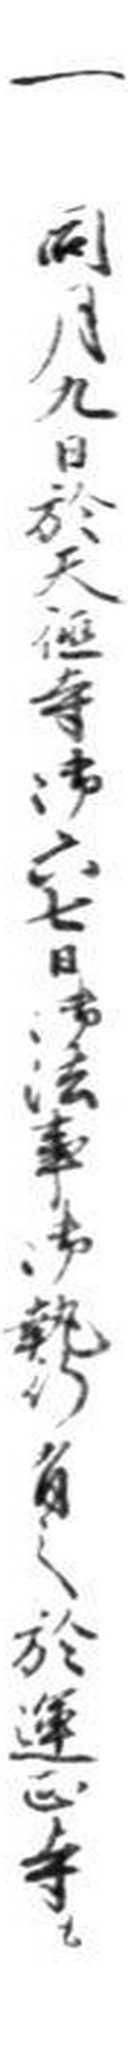一同月九日於天徳寺御六七日御法事御執行有之於運正寺も
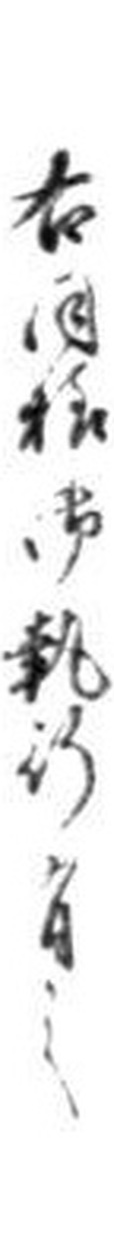右同様御執行有之
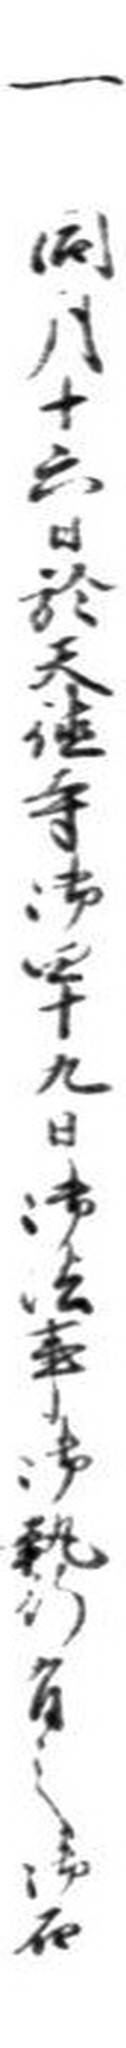一同月十六日於天徳寺御四十九日御法事御執行有之御石
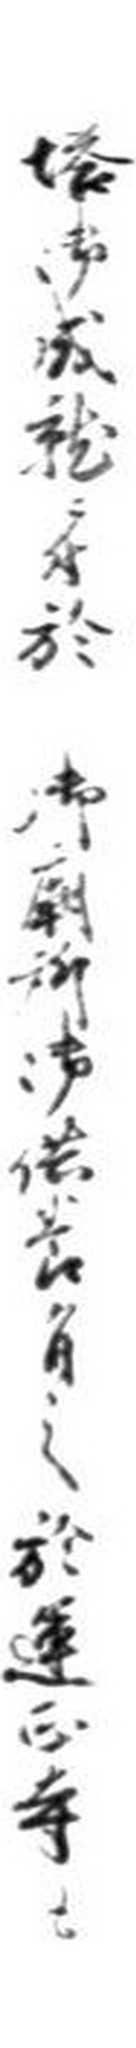塔御成就ニ付於御廟所御供養有之於運正寺も
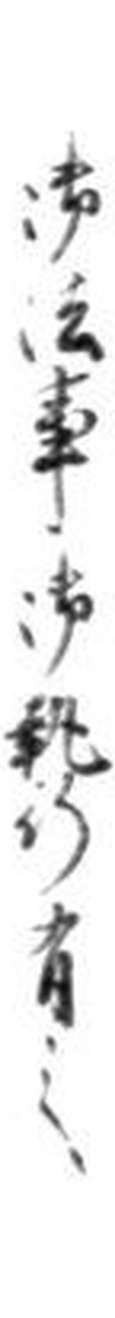御法事御執行有之
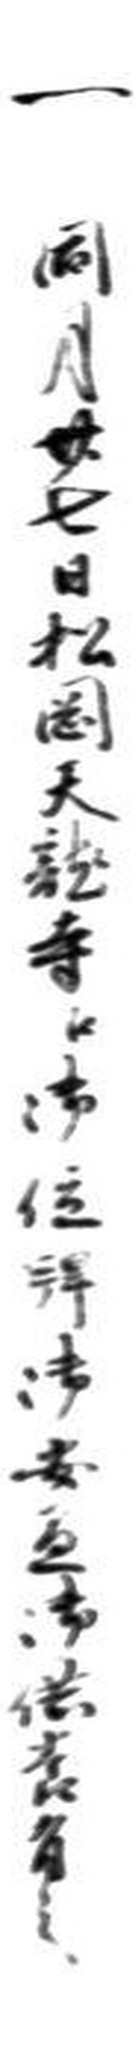一同月廿七日松岡天龍寺江御位牌御安置御供養有之
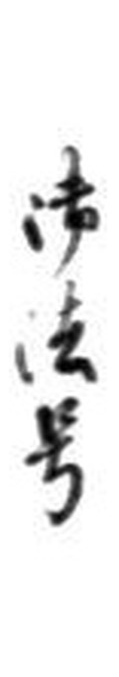御法号
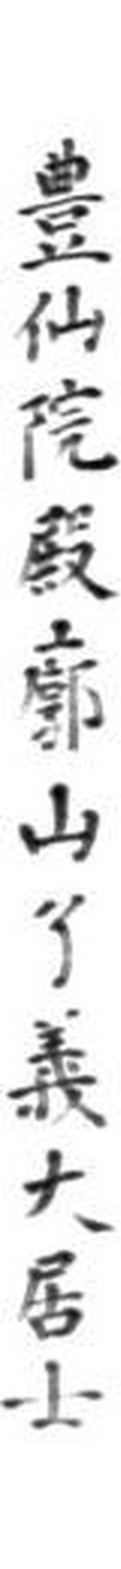豊仙院殿廓山了義大居士
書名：家譜 三十六 宗昌公 従享保八年到同九年
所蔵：福井県文書館 Fukui Prefectural Archives
